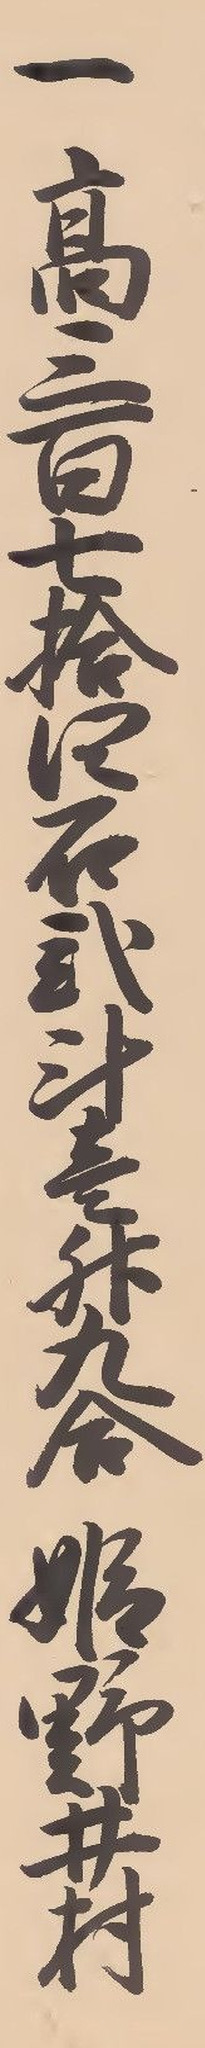一髙三百七拾四石弐斗壱升九合姫野井村
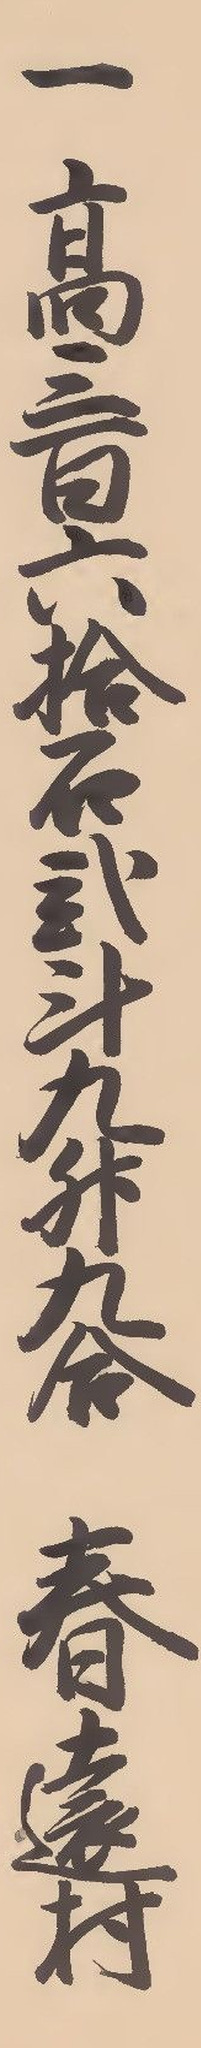一髙三百六拾石弐斗九升九合春遠村
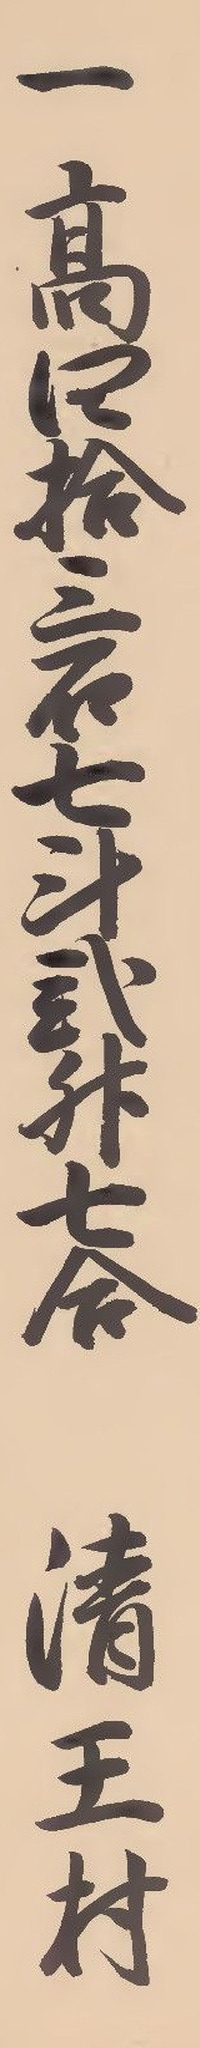一髙四拾三石七斗弐升七合清王村
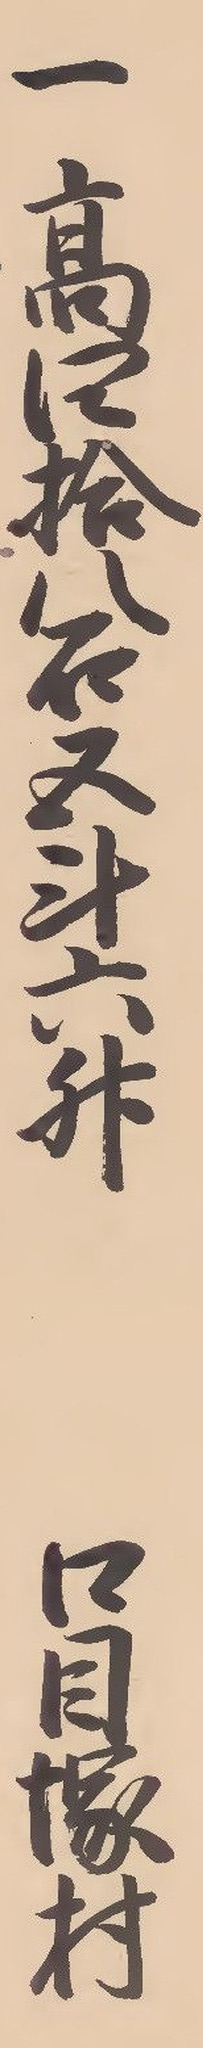一髙四拾八石五斗六升四目塚村

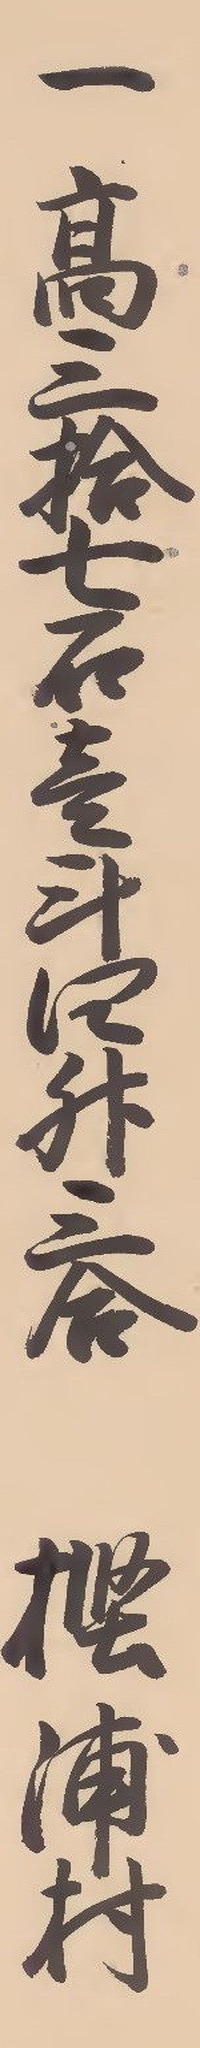一髙三拾七石壱斗四升三合浦村
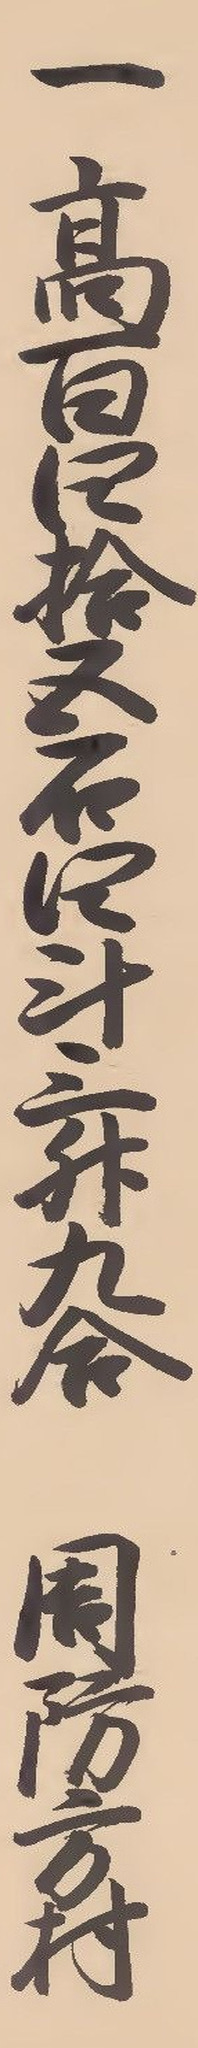一髙百四拾五石四斗三升九合周防方村
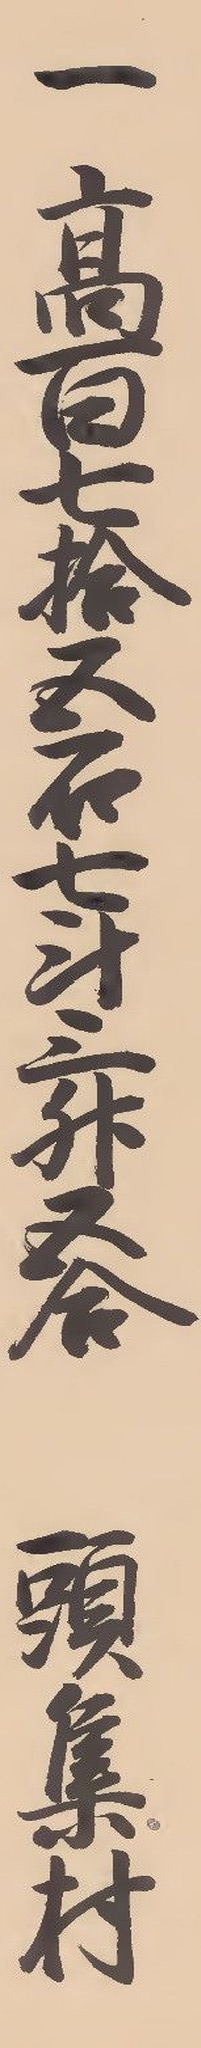一髙百七拾五石七斗三升五合頭集村
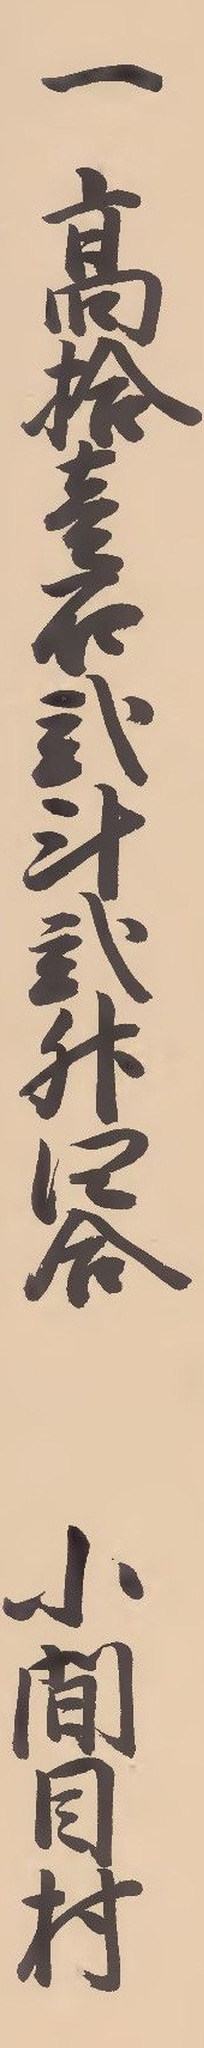一髙拾壱石弐斗弐升四合小間目村
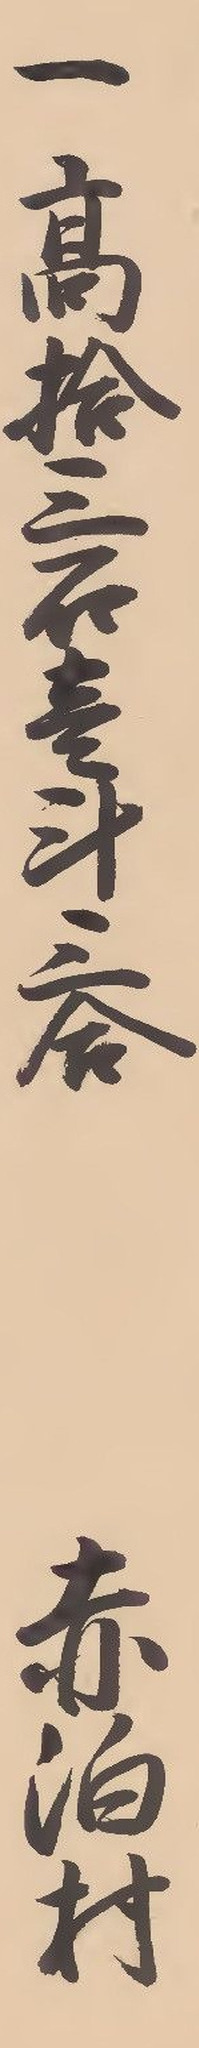一髙拾三石壱斗三合赤泊村
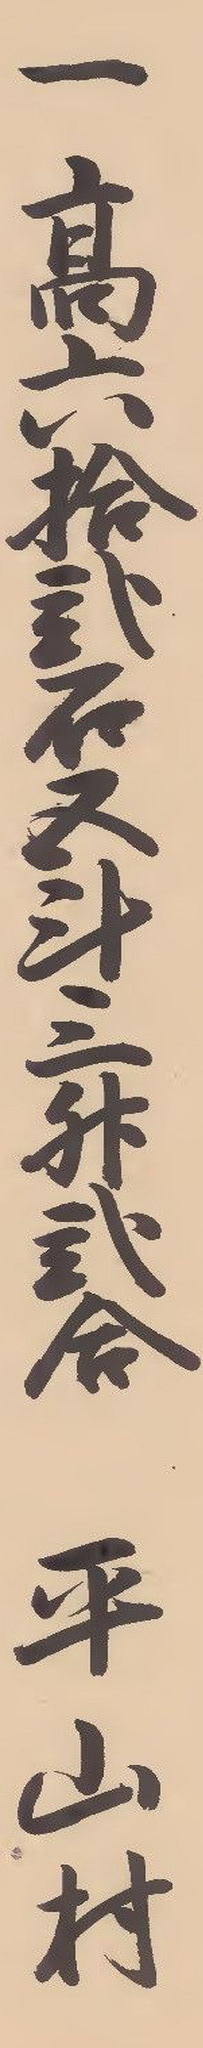一髙六拾弐石五斗三升弐合平山村
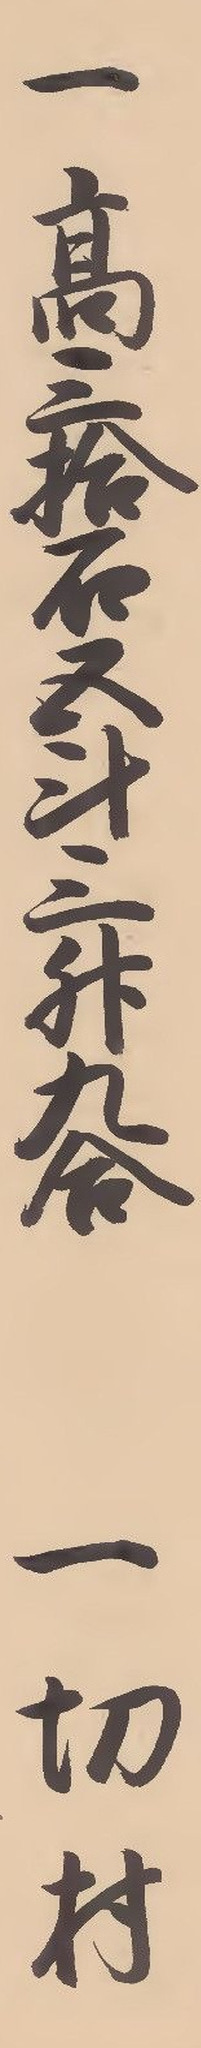一髙三拾石五斗三升九合一切村
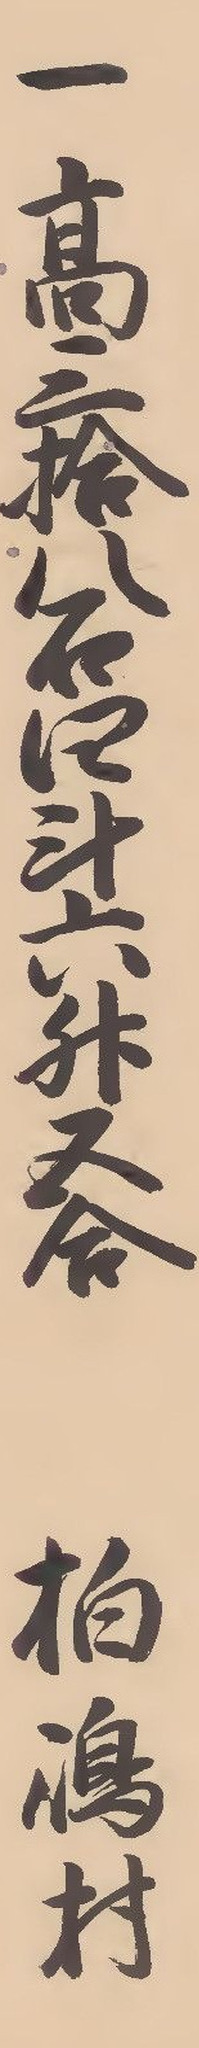一髙三拾八石四斗六升五合柏嶋村

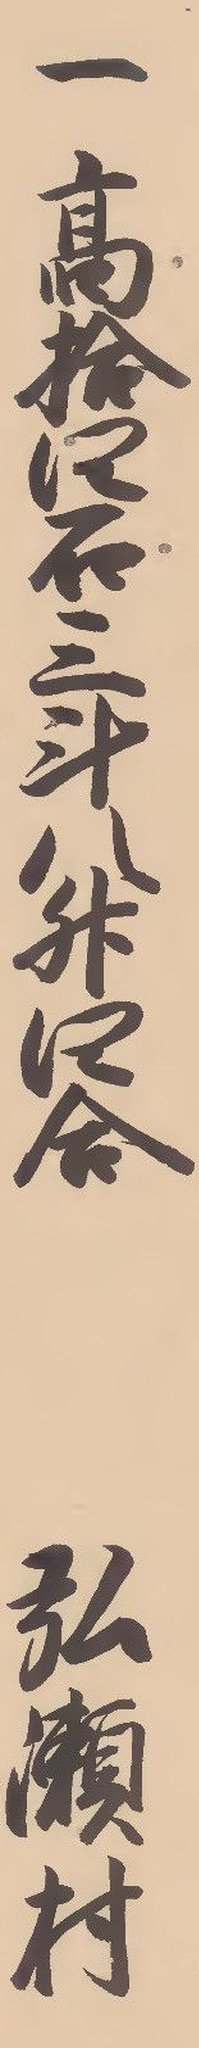一髙拾四石三斗八升四合弘瀬村
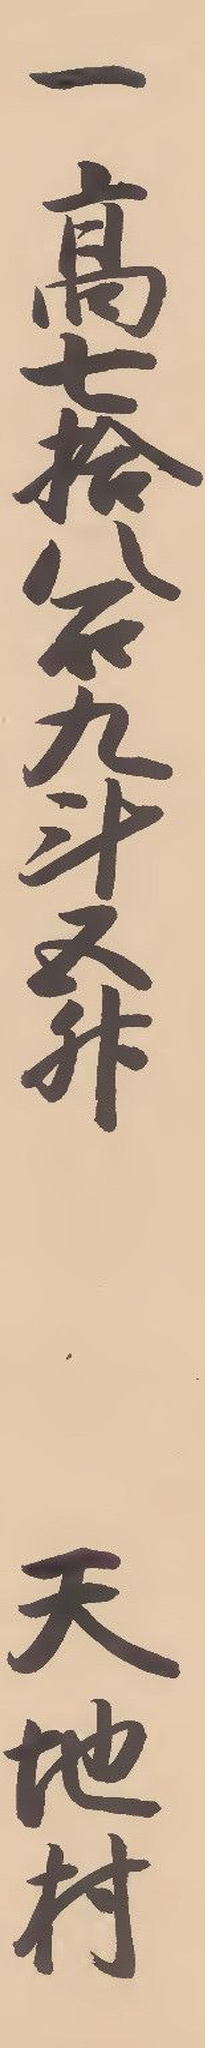一髙七拾八石九斗五升天地村
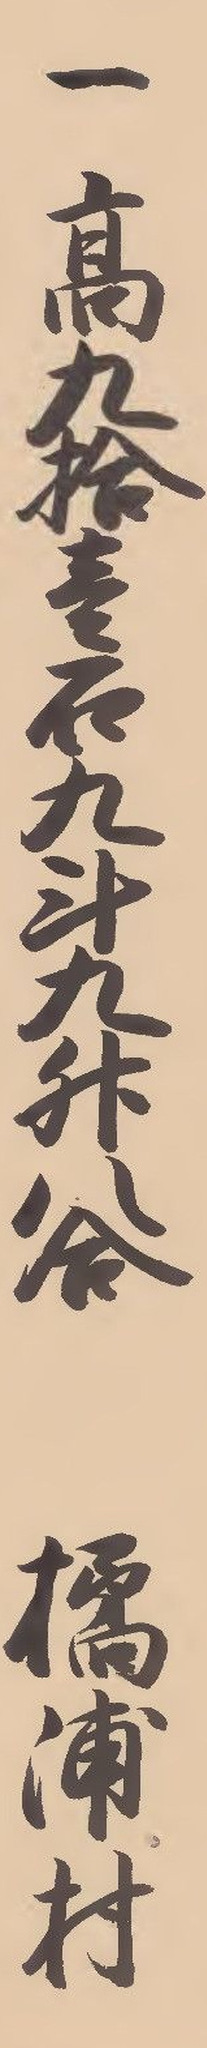一髙九拾壱石九斗九升八合橘浦村
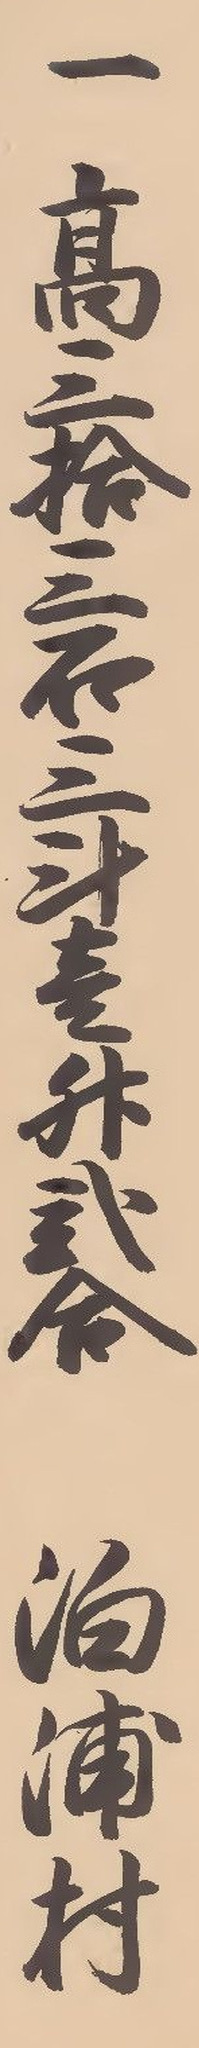一髙三拾三石三斗壱升弐合泊浦村
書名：土佐国郷帳
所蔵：国立公文書館 National Archives of Japan
